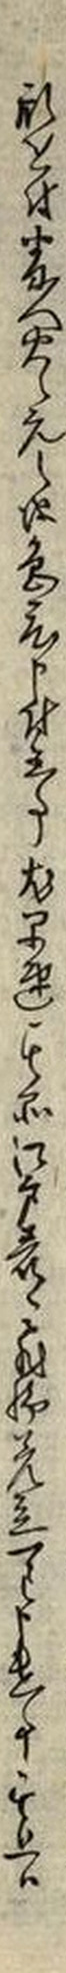形を付番人火之元之儀急度申付置候事尤早速其所江戸表へ飛脚差立可被申遣候事其上ハ
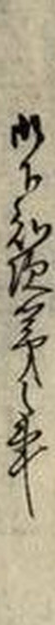御下知次第之事
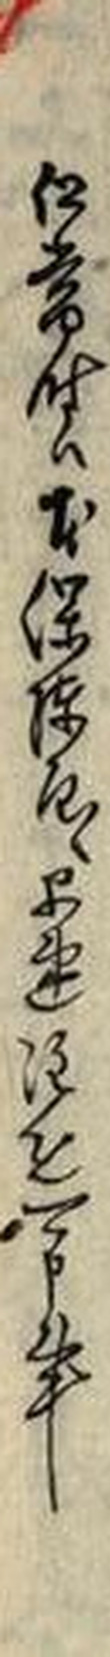但当時ハ本保陣屋へ早速注進可申事

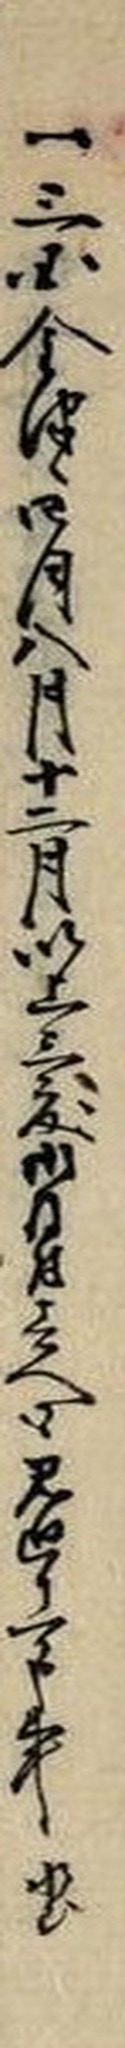一三国金津へ四月八月十二月以上三度御目付壱人ツヽ見廻り可申上事小玉
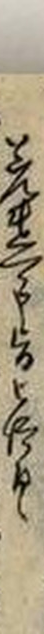差遣可申旨被仰付候
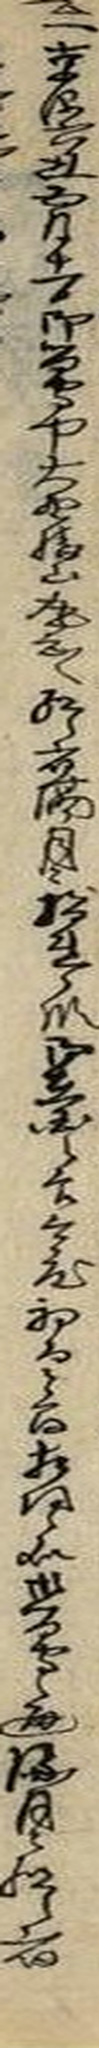△一享保六丑五月十一日御留守中大野勝山丸岡へ組之者隔月々指遣候段御在国之節今度初而ニ候間相伺候処御留守之通隔月々組之者
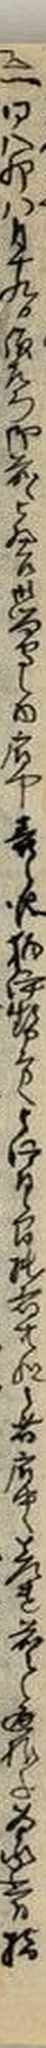△一同八卯八月十九日儀左衛門御前へ被為召御留守之内府中表之儀狛伊勢方へ被仰付候間能者共組之者府中へ差遣前々之通様子為承書付指
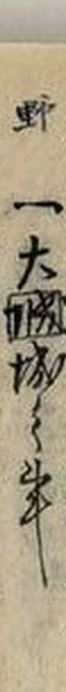野一大城城之事
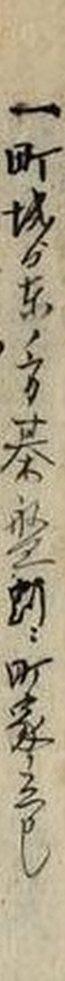一町城ゟ東ノ方碁盤割ニ町家立申候
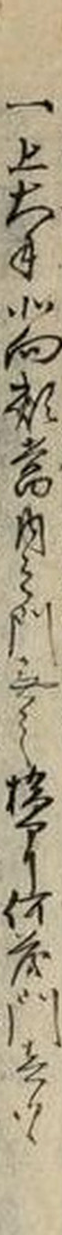一上大手北向頬当内之門無之橋アリ何茂門壱ツヽ
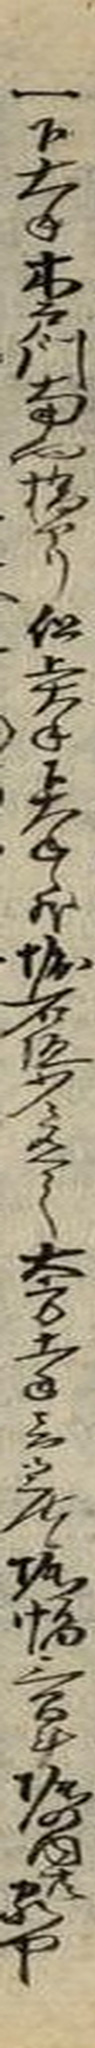一下大手木戸門南向橋アリ但上大手下大手之外堀石垣少々有之大方土手ニ而御座候堀幅三百斗堀の内共家中
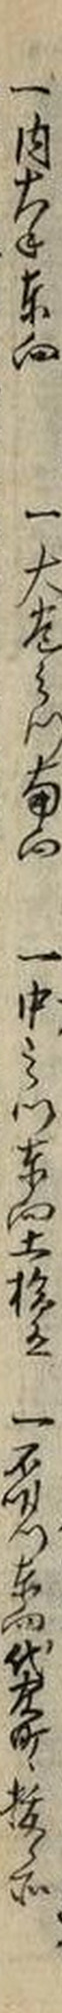一内大手東向一大巻之門南向一中之門東向土橋有一不明門東向代官町へ抜候所
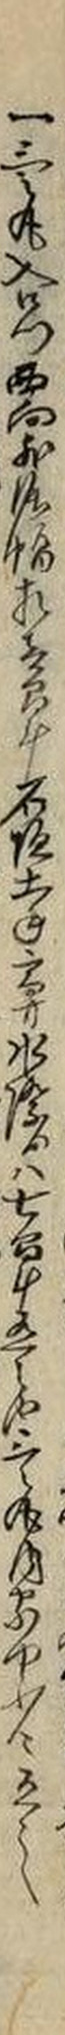一三之丸入口門西向外堀幅拾壱間斗石垣土手高サ水際ゟハ七間斗有之由三之丸内家中少々有之
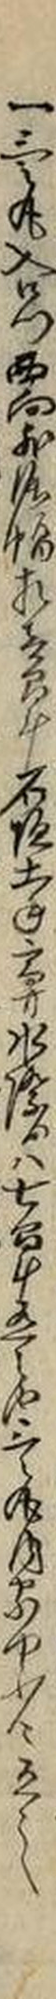一三之丸入口門西向外堀幅拾壱間斗石垣土手高サ水際ゟハ七間斗有之由三之丸内家中少々有之
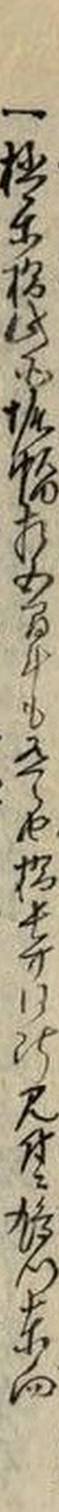一極楽橋此所堀幅拾五間斗も有之由橋長サ同断見付ニ鳩門東向
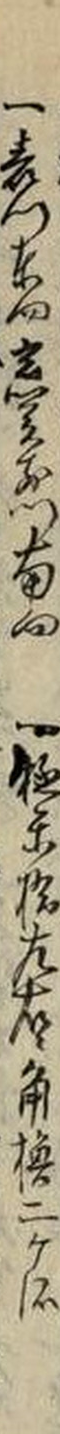一表門東向玄関前門南向一極楽橋左右ニ角櫓二ケ所
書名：御国他国諸事之部
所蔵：福井県文書館 Fukui Prefectural Archives
